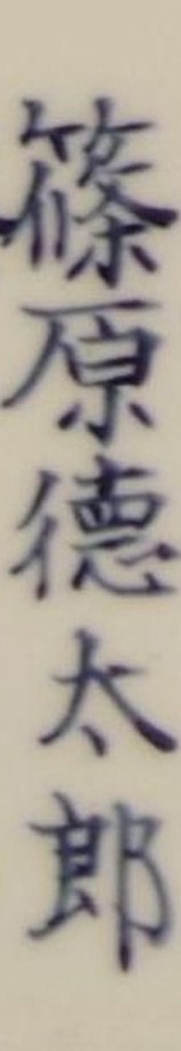篠原徳太郎
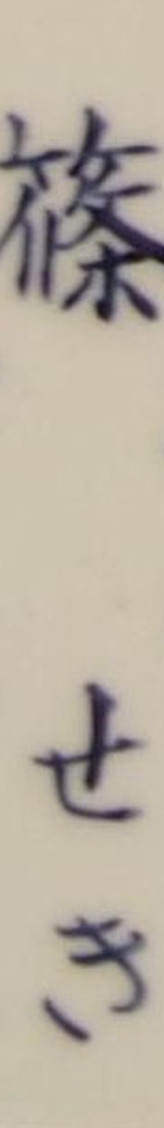篠せき

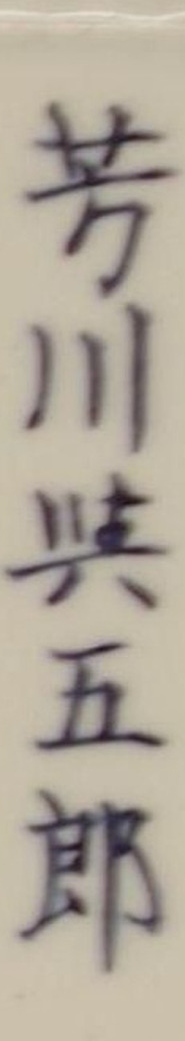芳川与五郎
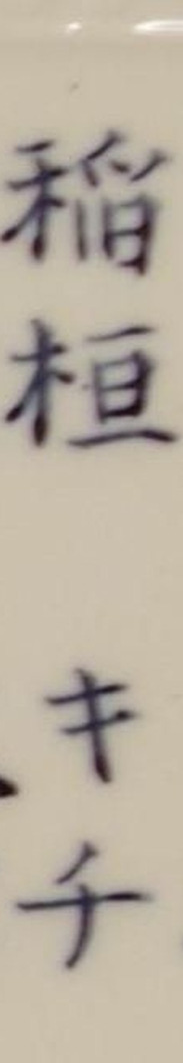稲桓キチ
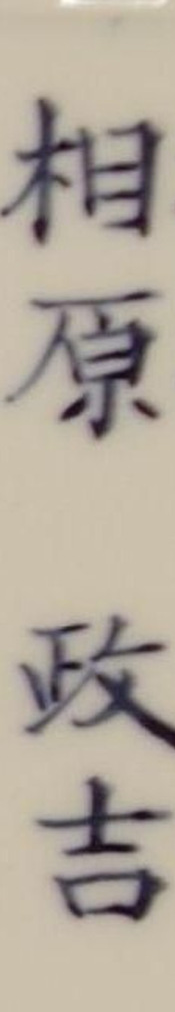相原政吉
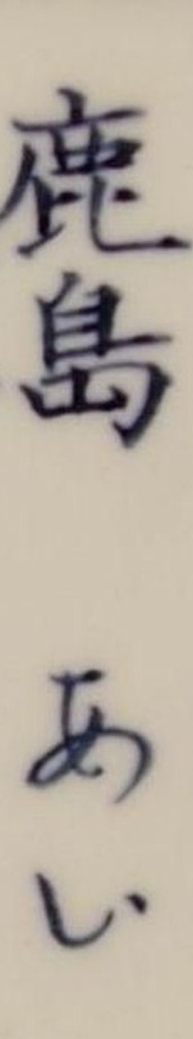鹿島あい
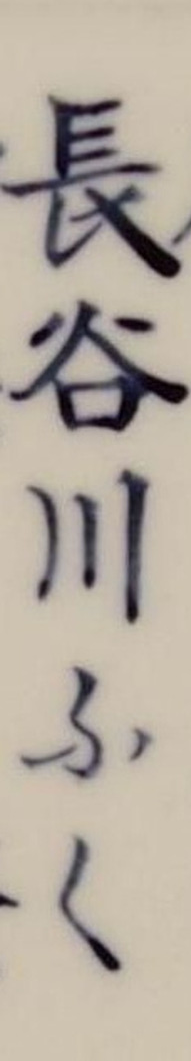長谷川ふく
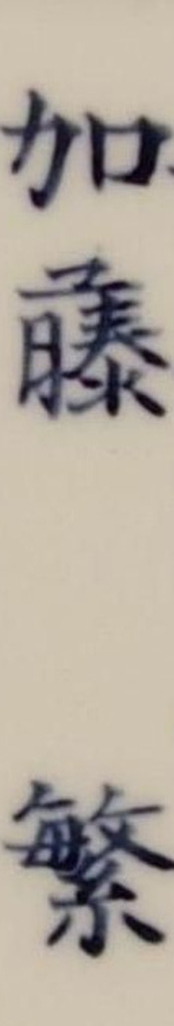加藤繁
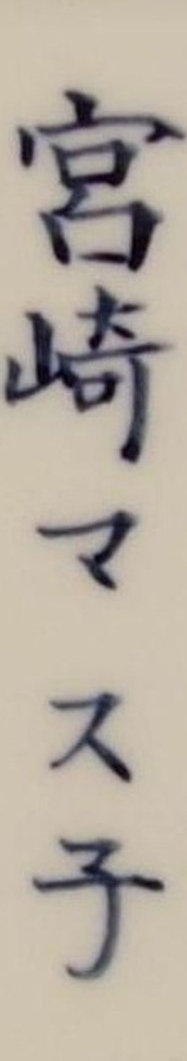宮崎マス子
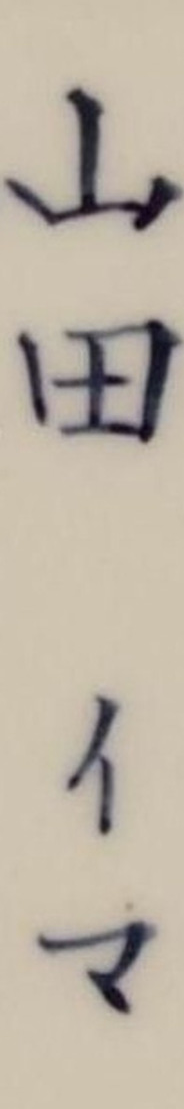山田イマ
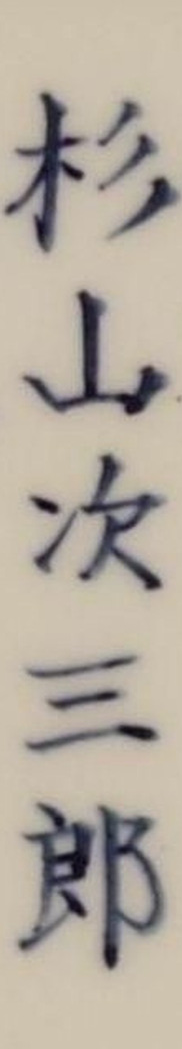杉山次三郎
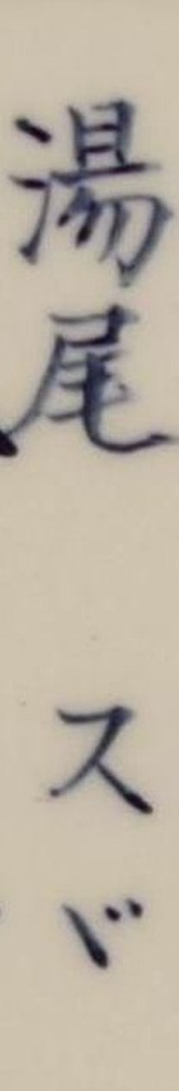湯尾スズ
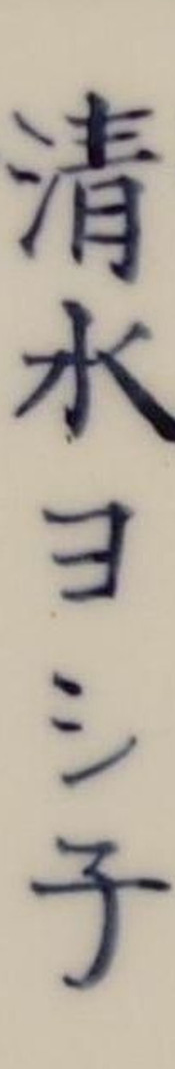清水ヨシ子
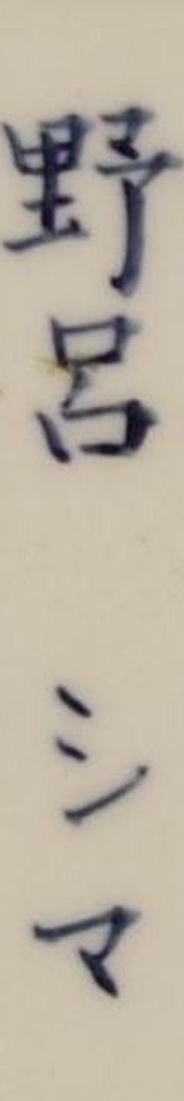野呂シマ
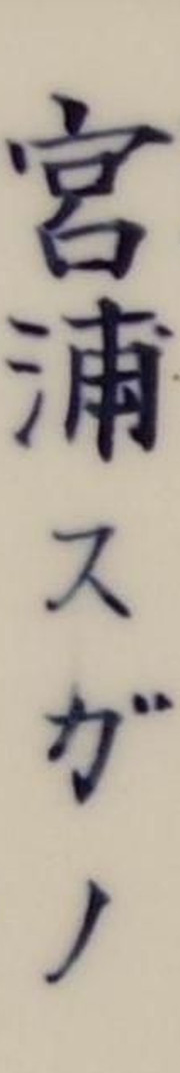宮浦スガノ
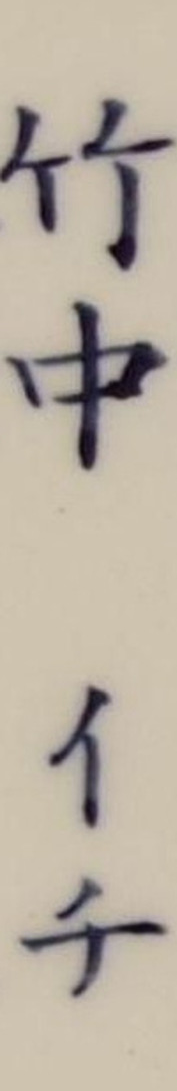竹中イチ
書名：M~S
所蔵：高野山金剛峯寺
